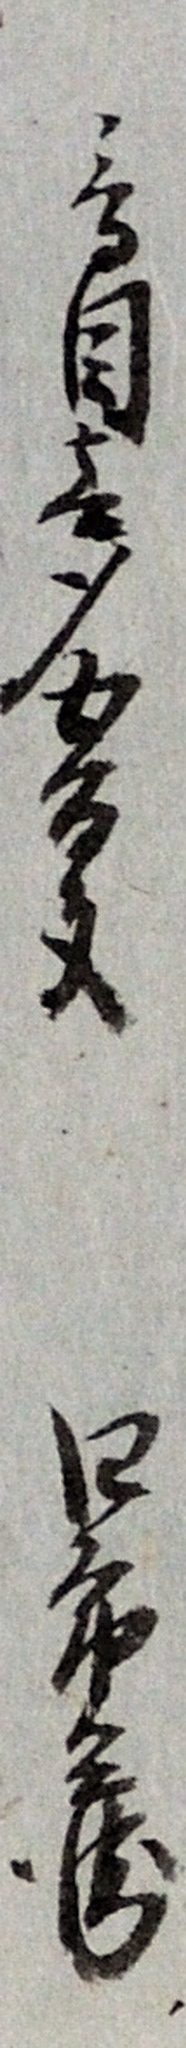鳥目壱貫五百文四郎兵衛
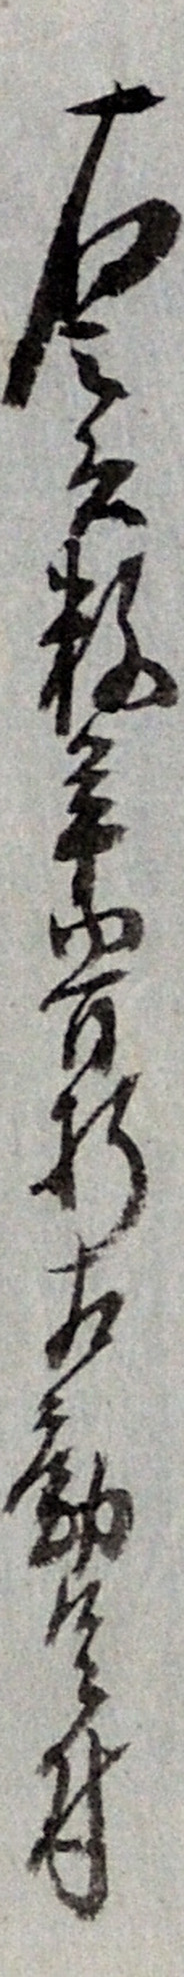右之者数年骨折相勤候ニ付
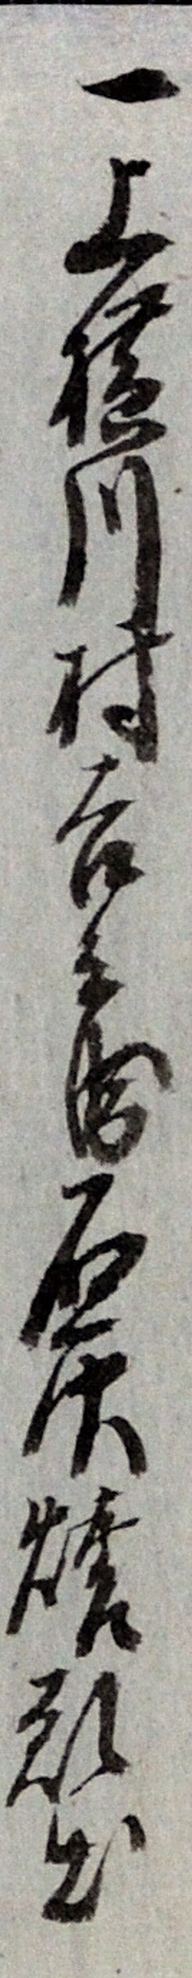一上横川村吉兵衛石灰焼願出
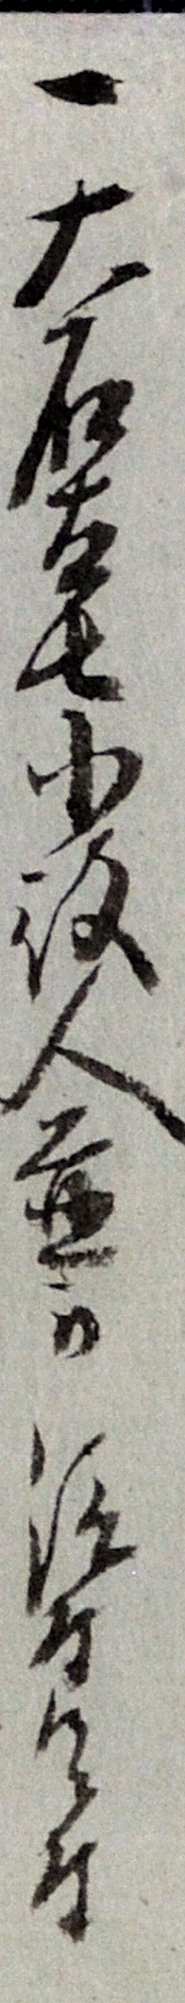一大石太七小役人並被仰付候ニ付
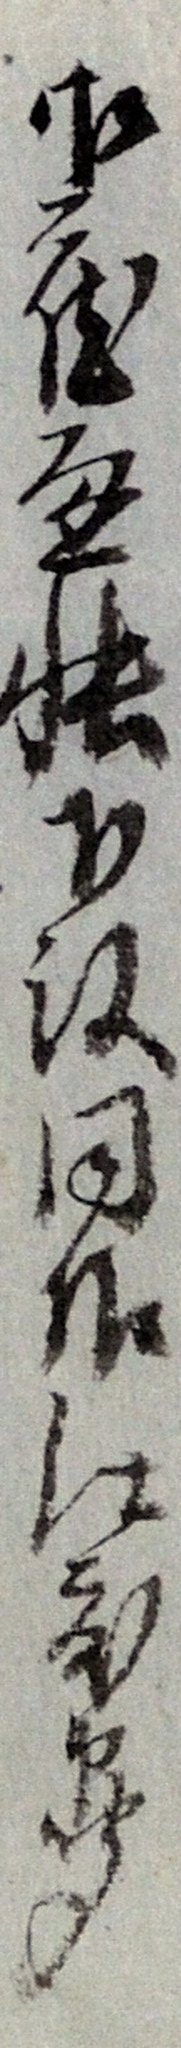御雇通帳下役同様仕度申聞
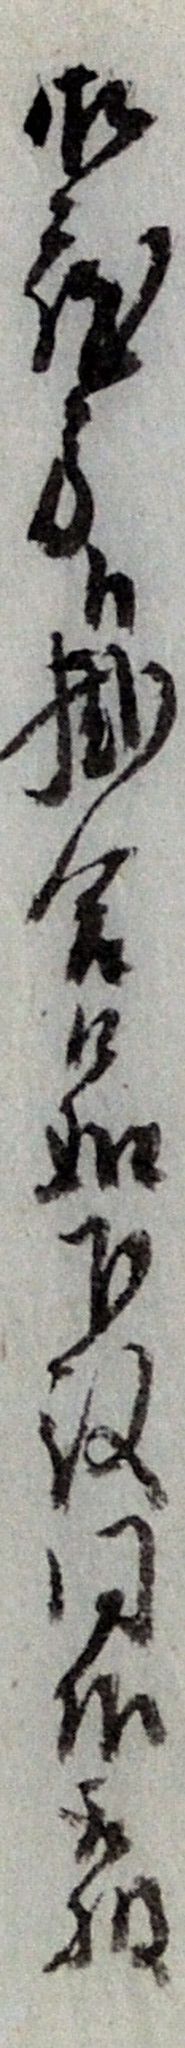御蔵方江掛合候処下役同様取扱
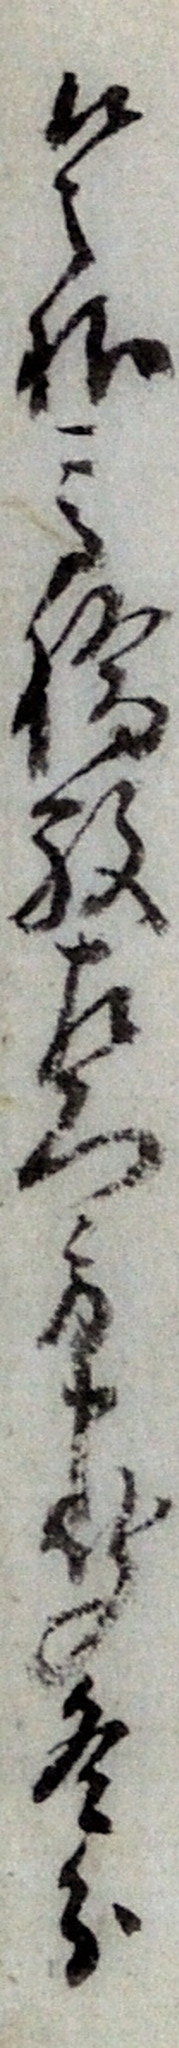候之様高橋紋左衛門方申聞冬分

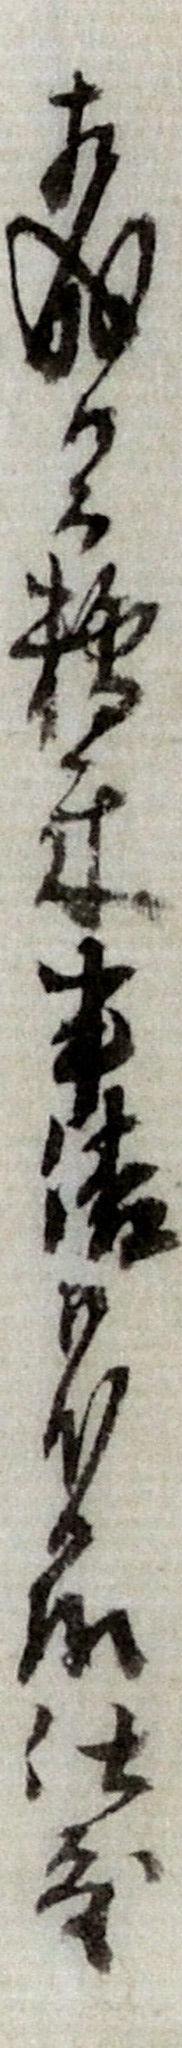相成候而糯米半俵御下候様仕度
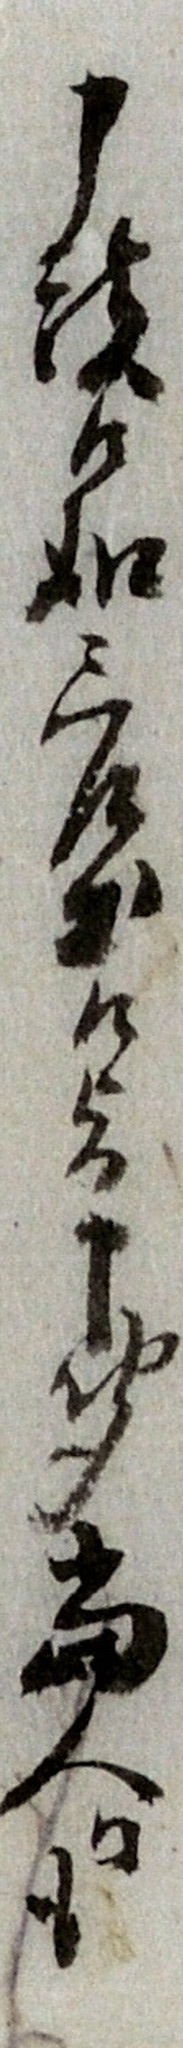申談候処差出候旨申聞当人江も
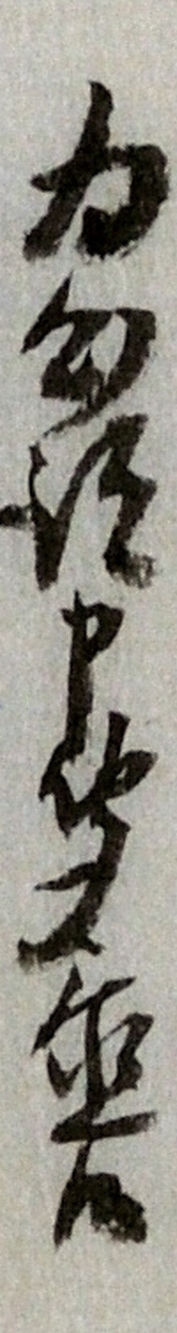為心得申聞置候
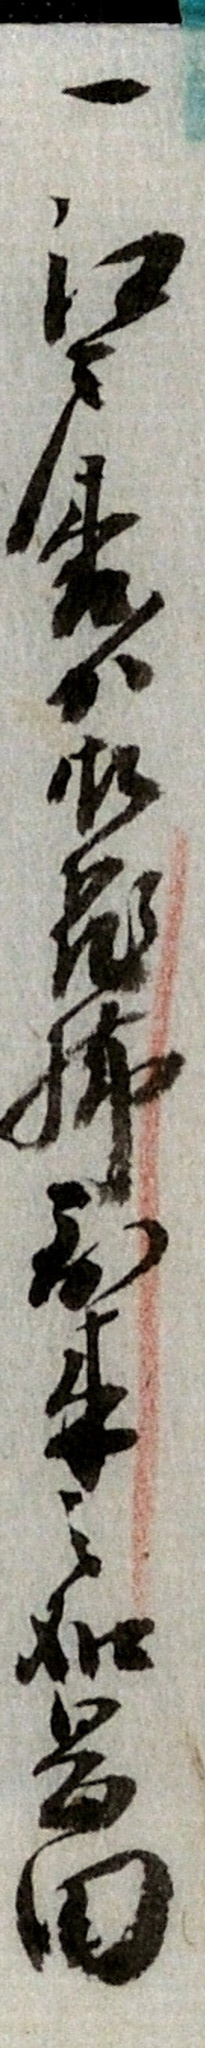一江戸表ゟ御飛脚到来之処岡田
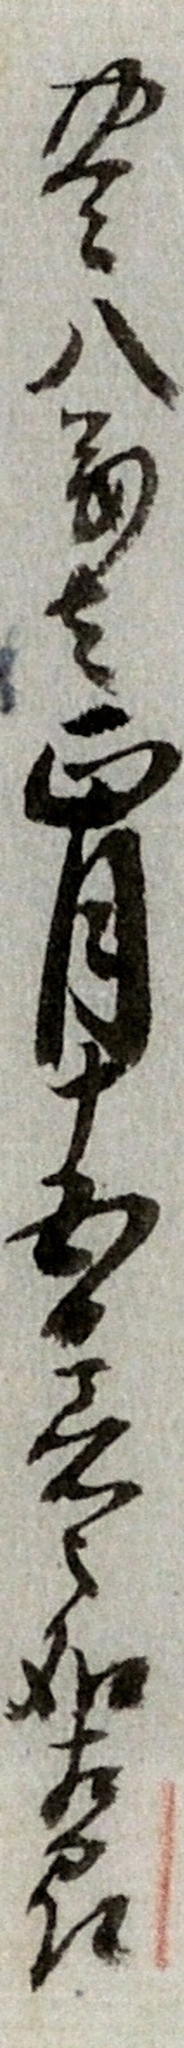豊八義者正月十五日着之処相尋
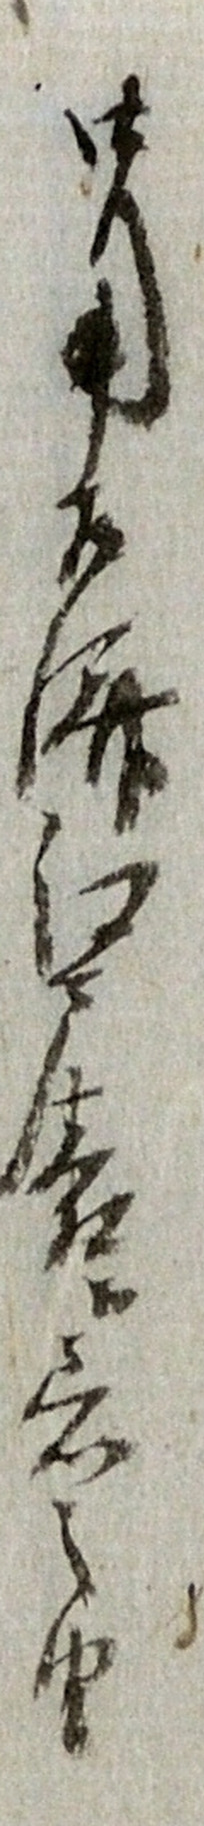御用相済江戸表江着之由
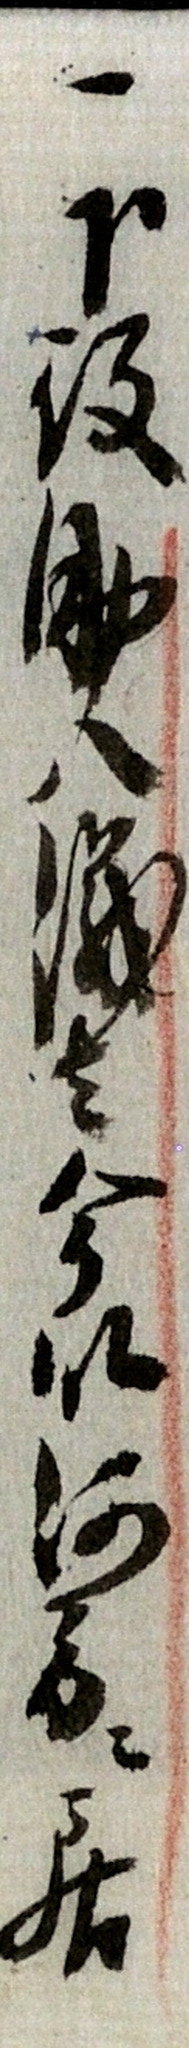一下役助八儀者今以何方ニ居
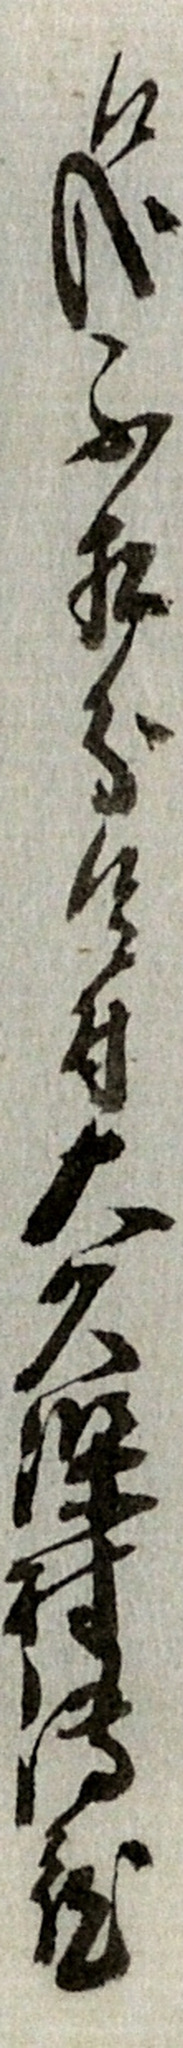候哉不相分候ニ付大久保村御蔵
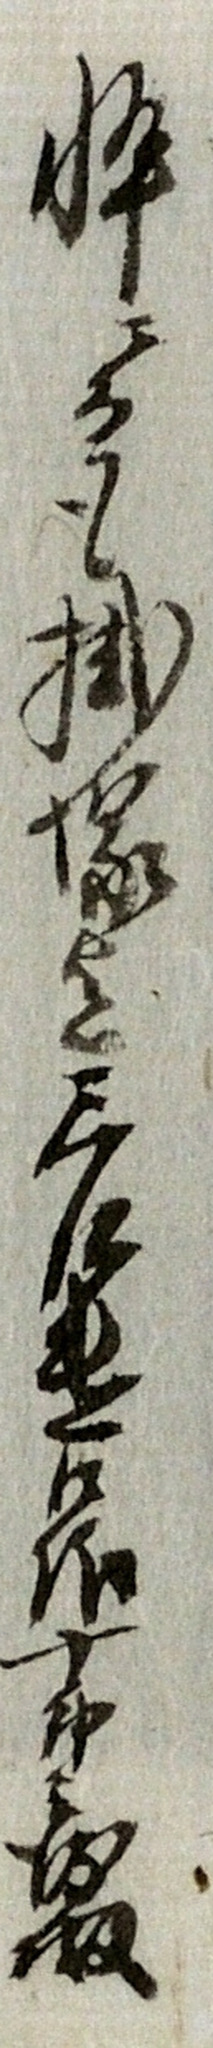倅ニ而も掛塚迄差遣候様十郎兵衛殿
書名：諸事御用留
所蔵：伊那市立高遠町図書館・合同会社AMANE
